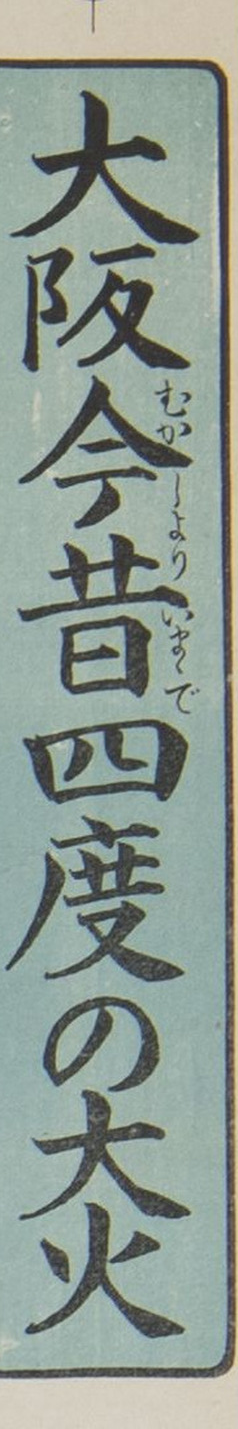大阪今昔四度の大火
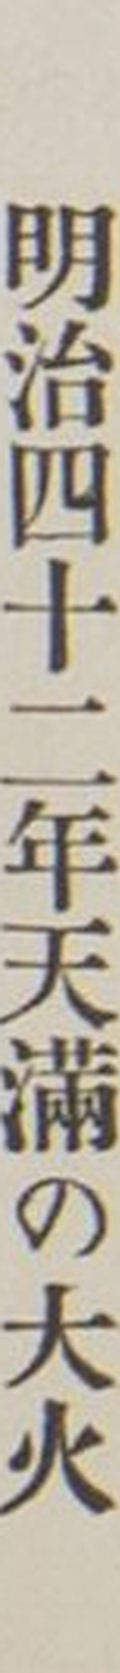明治四十二年天満の大火
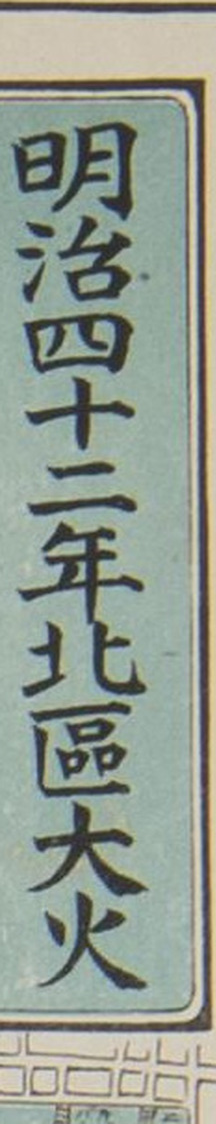明治四十二年北区大火
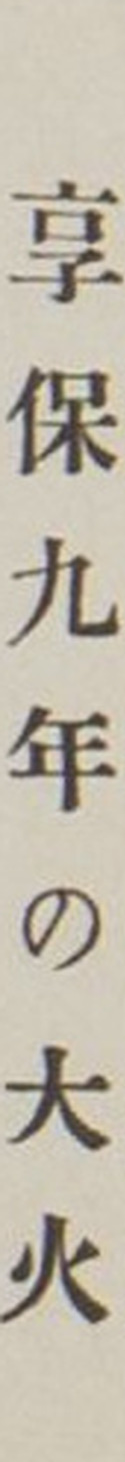享保九年の大火
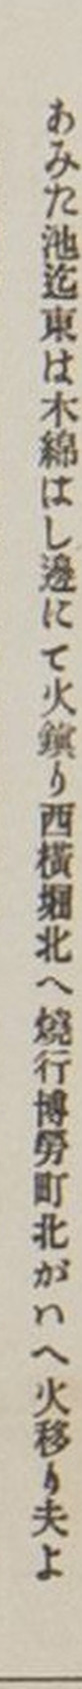あみた池迄東は木綿はし邊にて火鎮り西横堀北へ焼行博労町北がはへ火移り夫よ
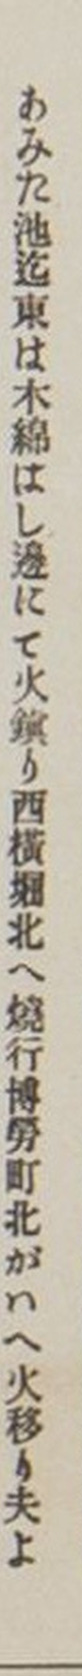あみた池迄東は木綿はし邊にて火鎮り西横堀北へ焼行博労町北がはへ火移り夫よ
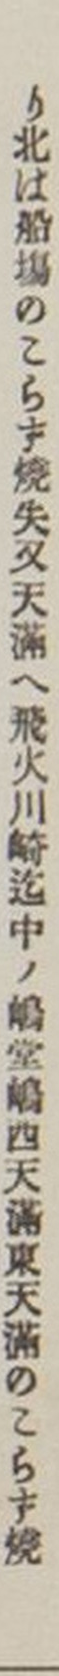り北は船場のこらず焼失又天満へ飛火川崎迄中ノ島堂島西天満のこらず焼
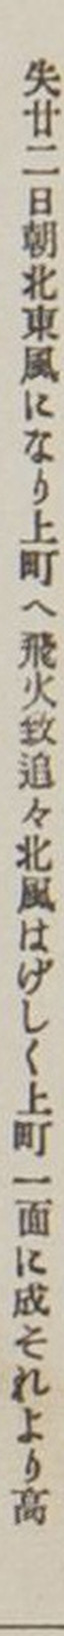失廿二日朝北東風になり上町へ飛火致追々北風はげしく上町一面に成それより高
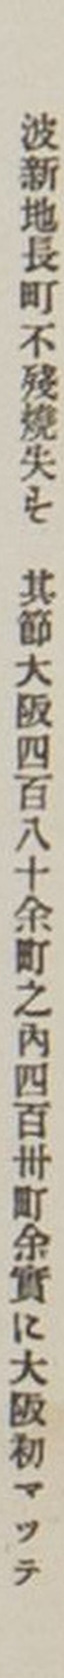波新地長町不残焼失す其節大阪四百八十余町之内四百丗町余実に大阪初マツテ
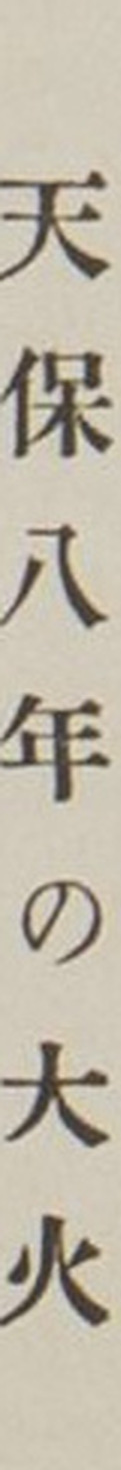天保八年の大火
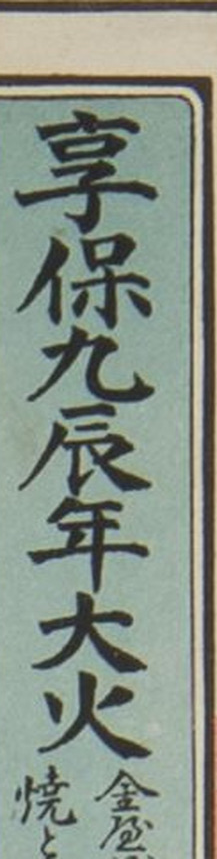享保九年の大火
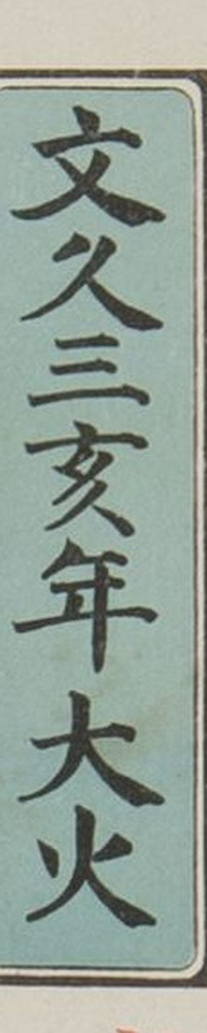文久三年の大火
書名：大阪今昔四度の大火
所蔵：あいおいニッセイ同和損保株式会社
